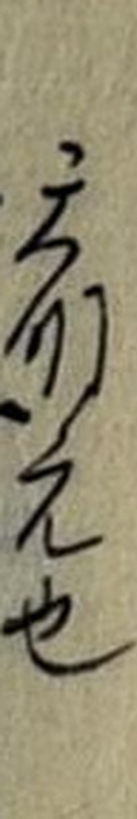天明元也
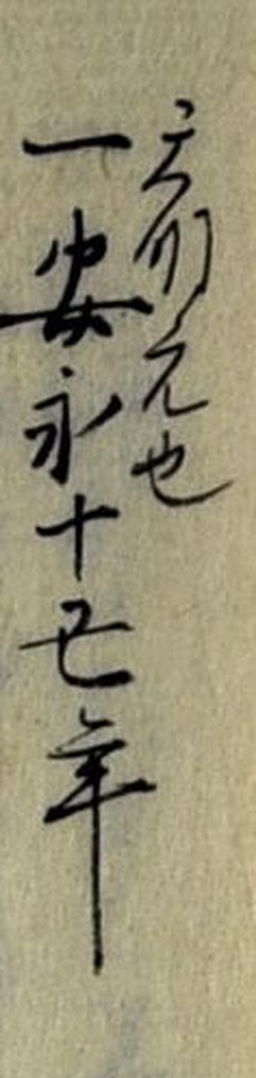一安永十丑年
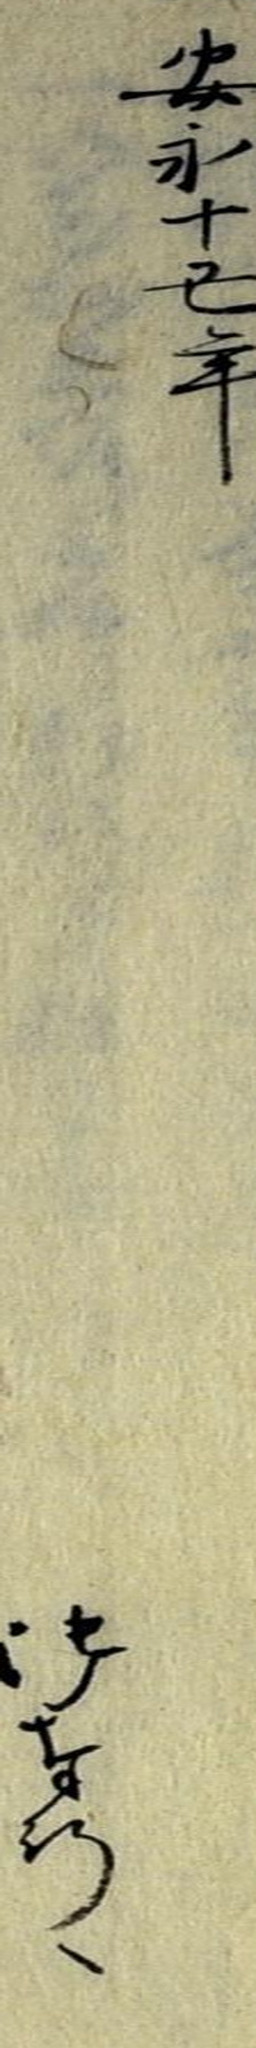御奉行へ
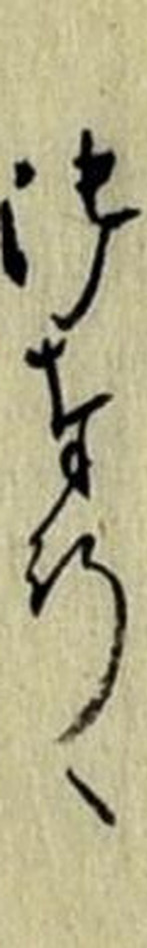御奉行へ
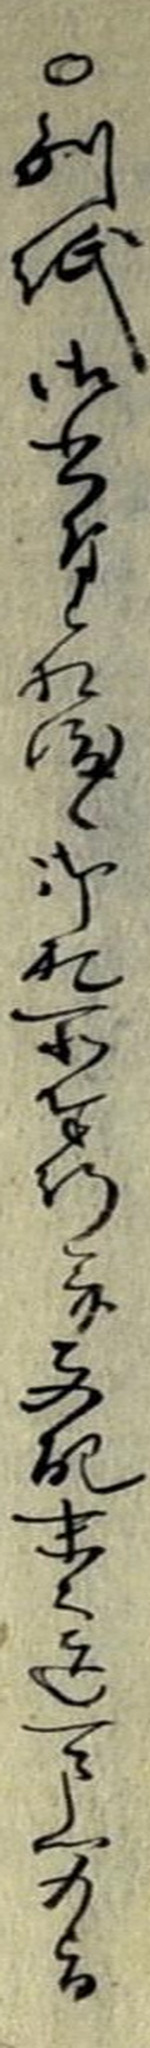〇別紙御書付被相渡候御札所奉行并支配末々迄可申聞旨
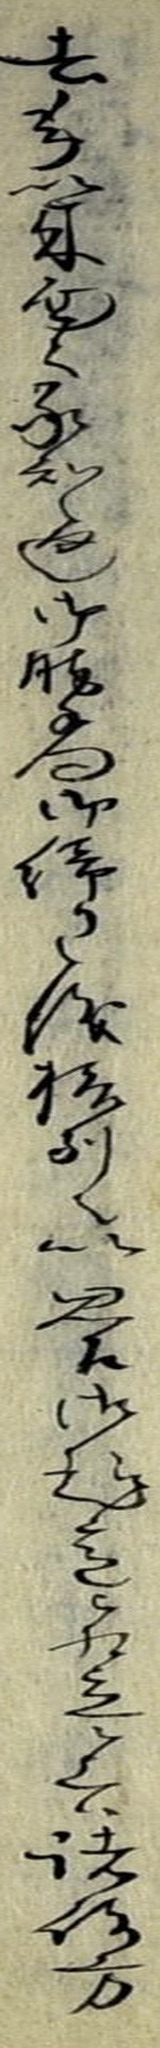去年以来面々承知之通御勝手向御締り之儀格別之以思召御趣意被相立候上は諸役方
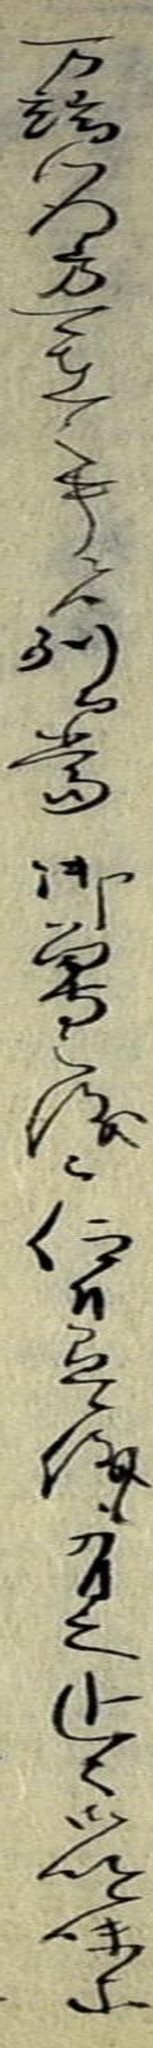万端心得方可在之事には別而当御留守之儀被仰付置候儀も有之追々御吟味等
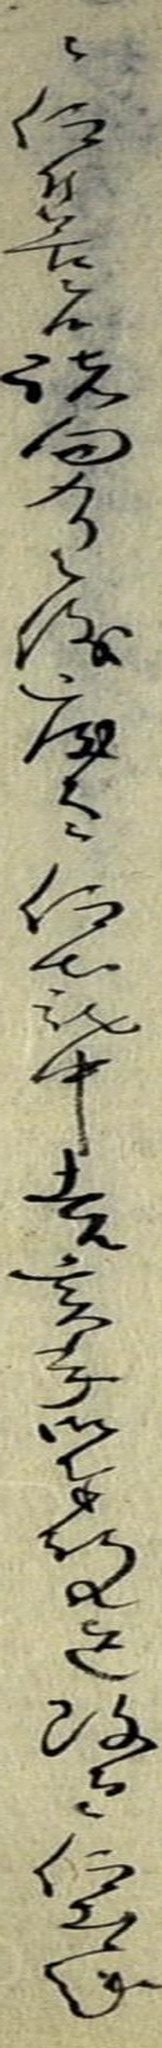被仰付筈に候諸向〆り之儀度々被仰出就中去る亥年御奉行共迄改而被仰出候趣
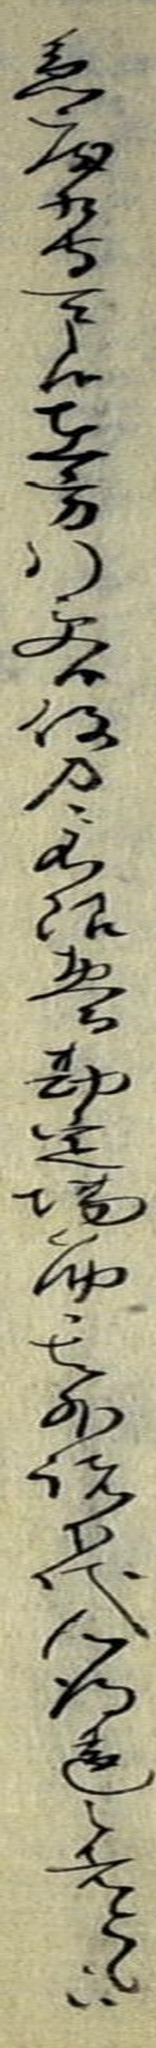急度相守可申候在方引受候役方に不限惣而勘定場筋其外諸下代心得違之者ともは
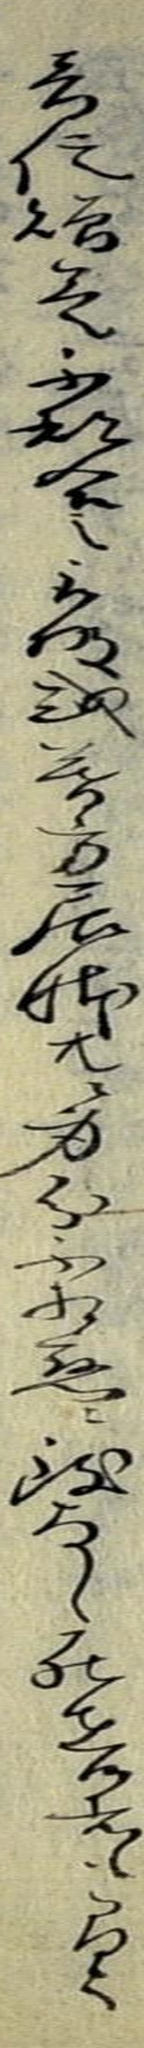音信贈答不都合之取扱或暮方居躰共に身分不相応に致なし罷在候者も間々
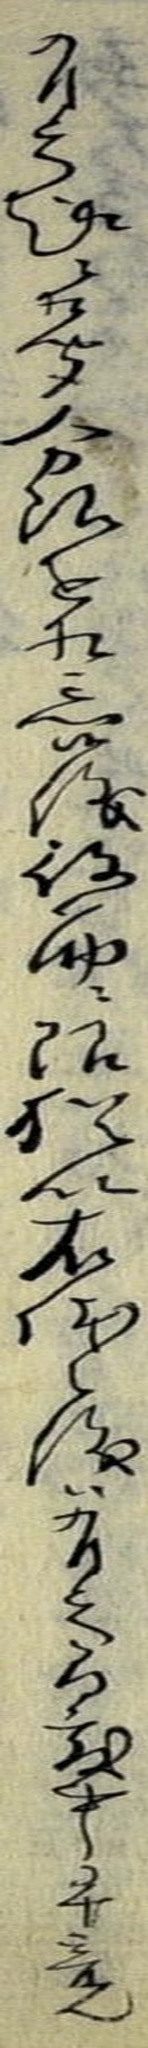有之趣に相聞分限を相忘候儀役筋に限猶以右体之儀は有之間敷事畢竟
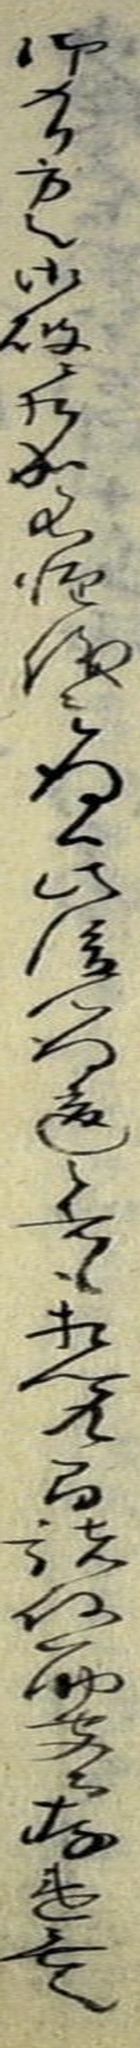御〆り方之御破に相成不軽儀に候得は此後心得違之者も相聞候間諸役筋決而存遣無之
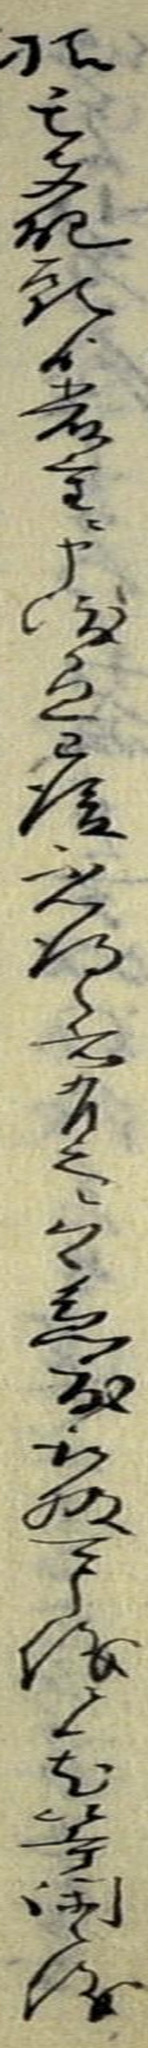様其支配頭ゟ厳重に申渡置已後不心得之者有之候はゝ急度取扱可申儀に候尤等閑之儀
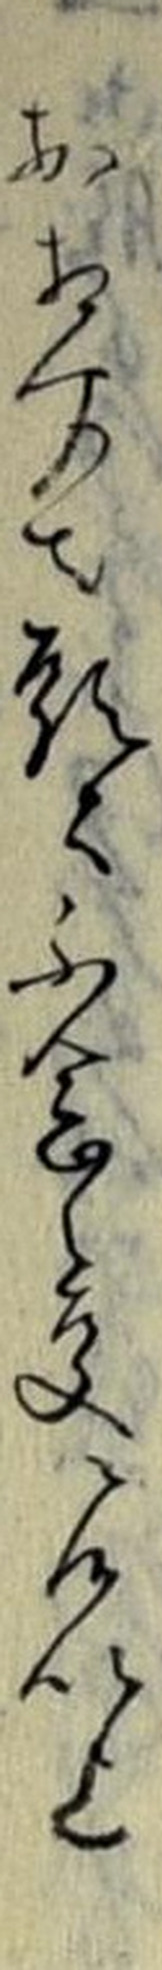於相聞は頭々不念之事に候以上
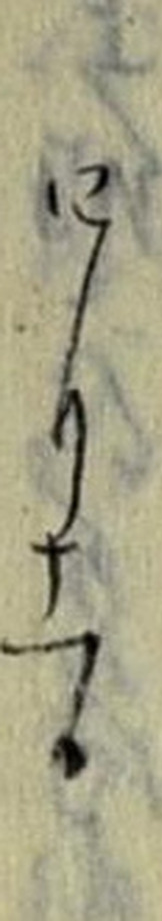四月十一日
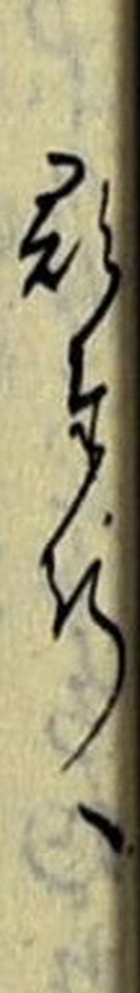郡奉行へ
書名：命令之部 二
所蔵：福井県文書館 Fukui Prefectural Archives
